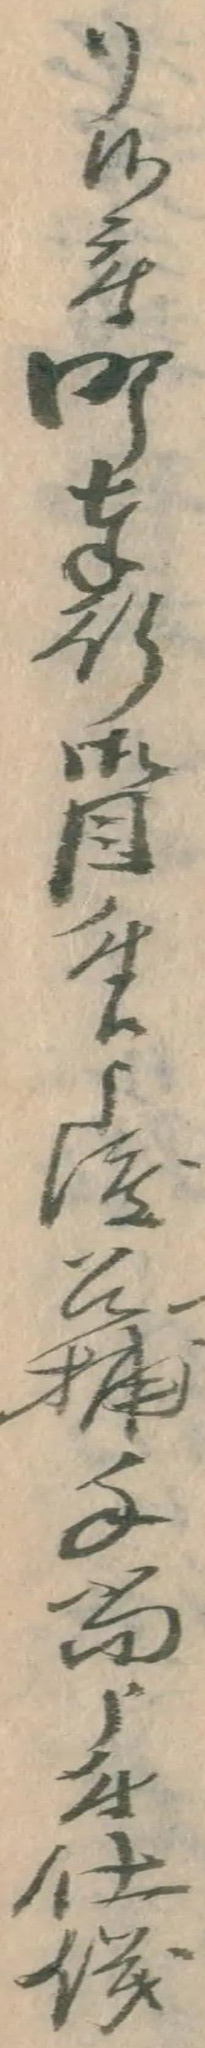り候ニ付町奉行御目付え申渡召捕手當申付仕儀

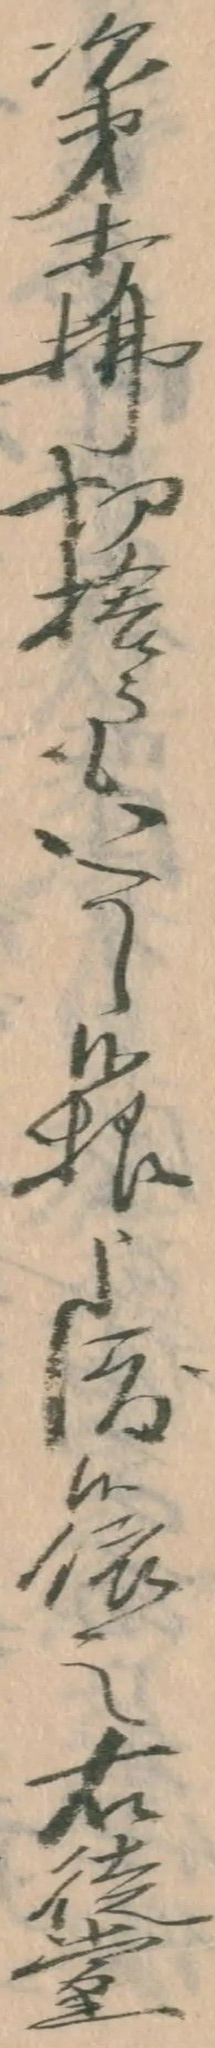次第打払切捨ニもいたし候様申渡候依之右徒党
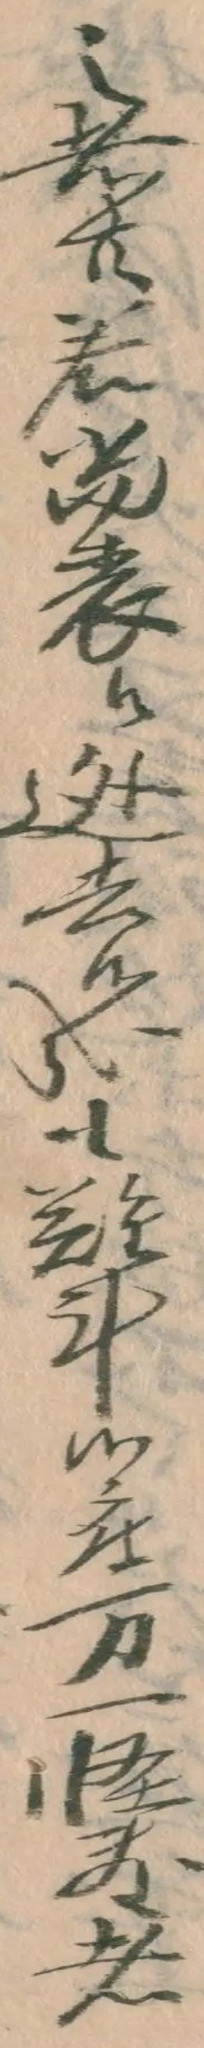之者共若當表江逃去候哉も難斗候ニ付万一怪敷者
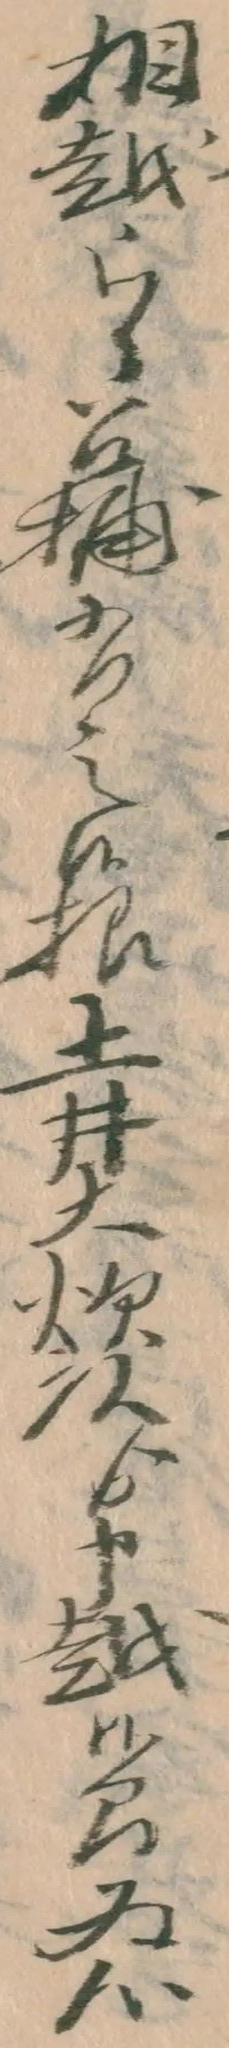相越被下召捕有之候様土井大炊頭ゟ申越候間為心
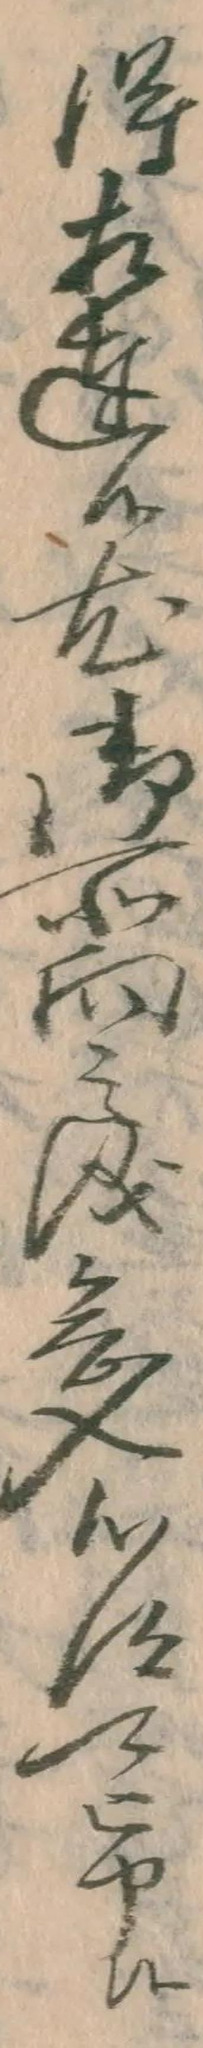得相達候尤御所向之儀急入候得可被申候
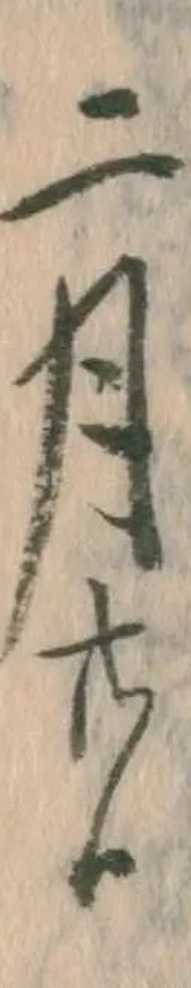二月廿日
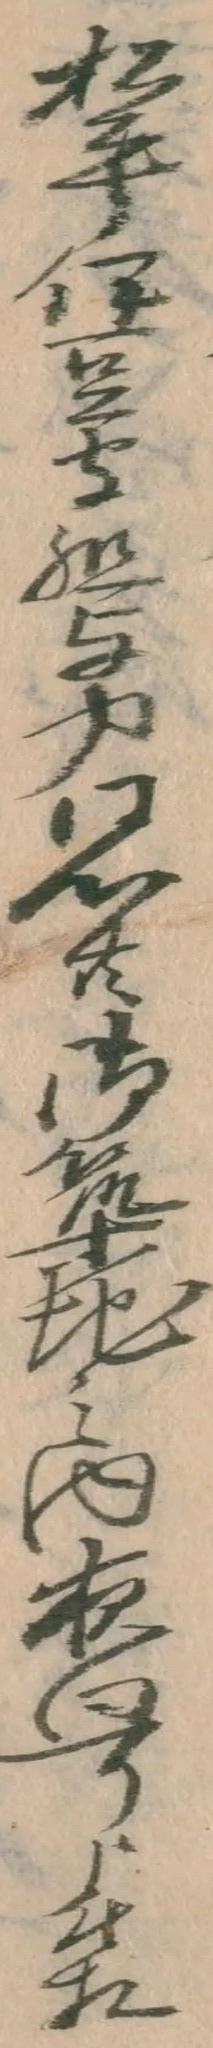松平伊豆守組与力同心共御築地之内夜廻り申付相
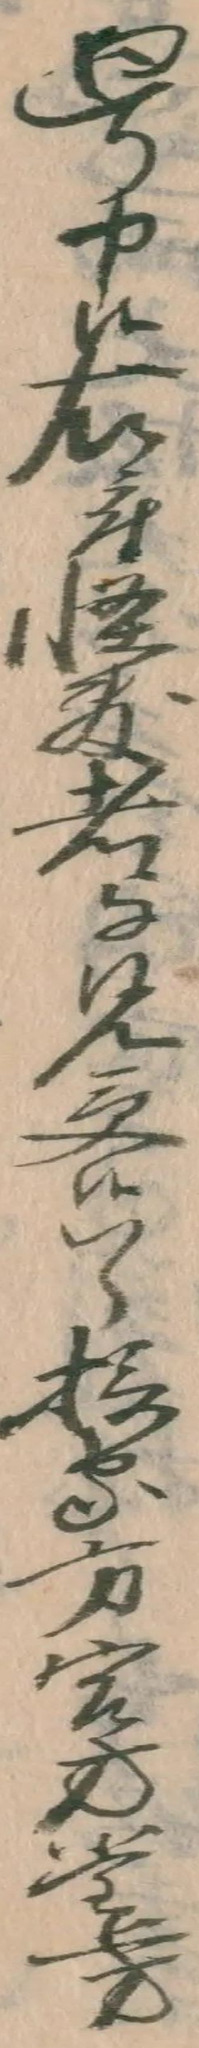廻り申候右ニ付怪敷者と見受候ハヽ摂家方宮方堂上方
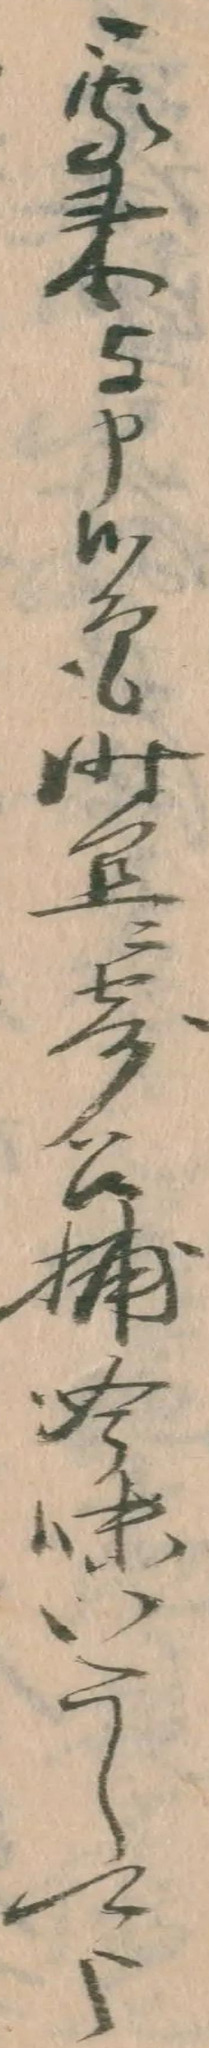御家来と申候而も時宜二寄召捕吟味いたし可申
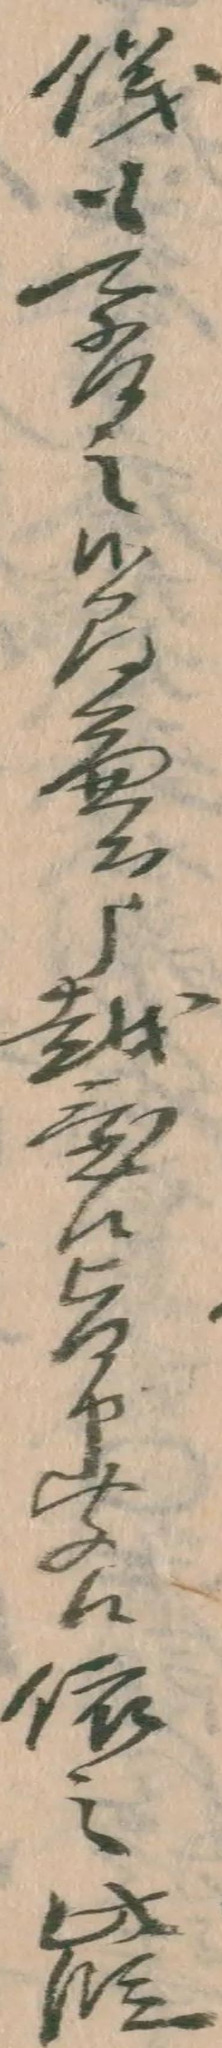儀も可有之候間兼而申越置候旨申聞候依之此段
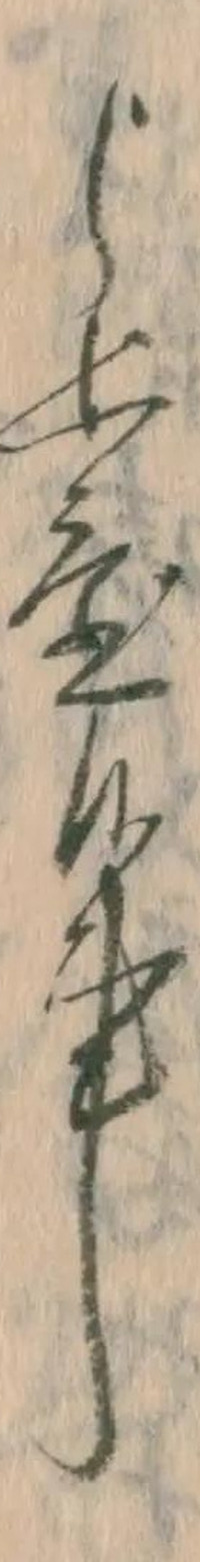申上置候事
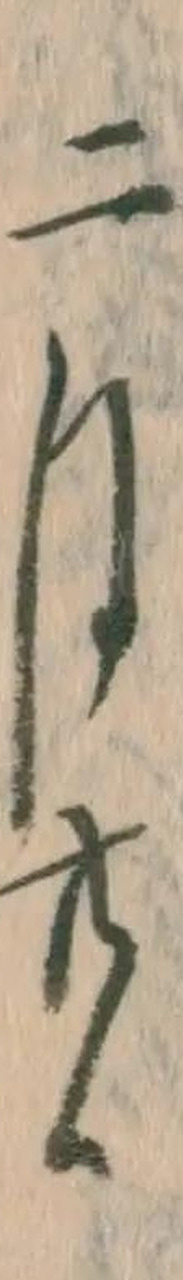二月廿日
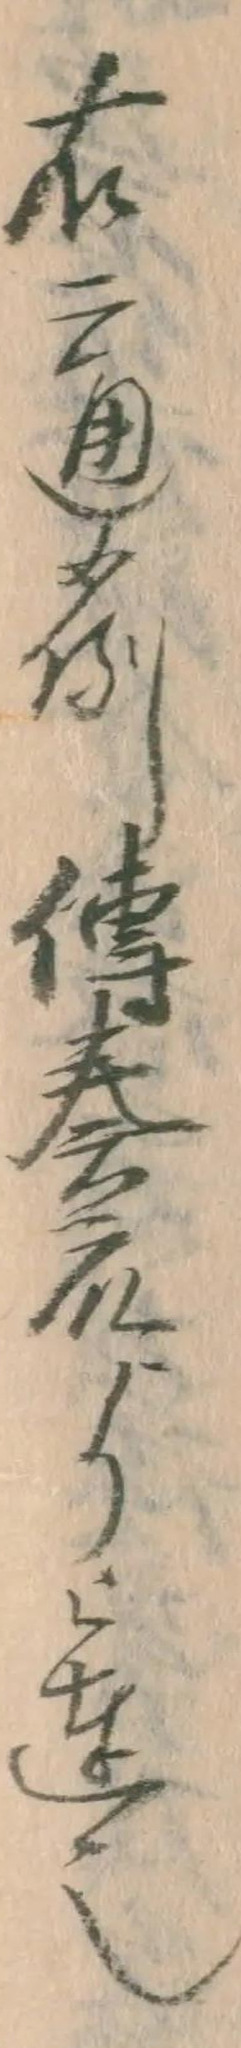右二通如例傳奏衆より被達也
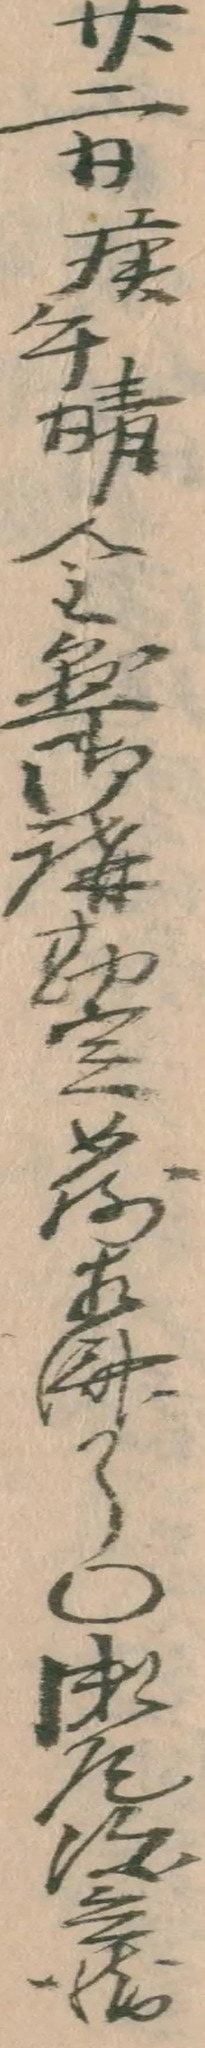廿二日庚午晴金懸御講勘定如例相済了〇瀬尾治兵衛
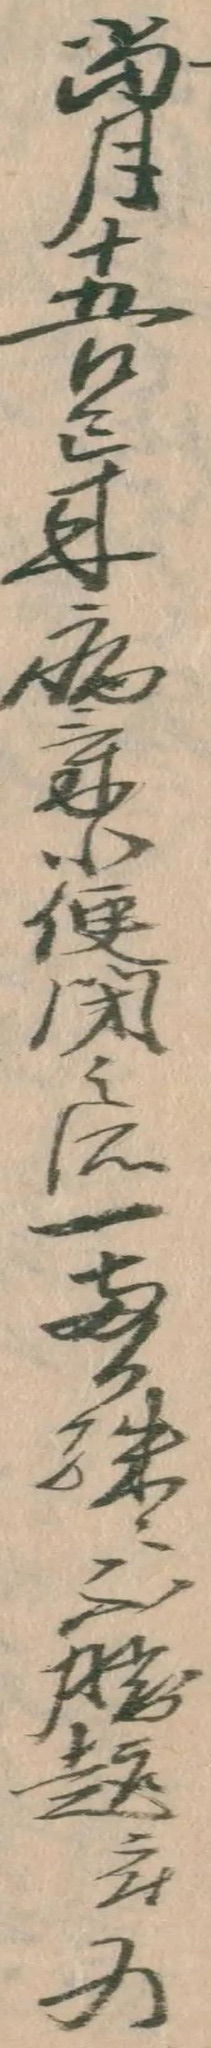當月十五日已来病氣小便閉之所一両日殊に不勝趣ニ付為
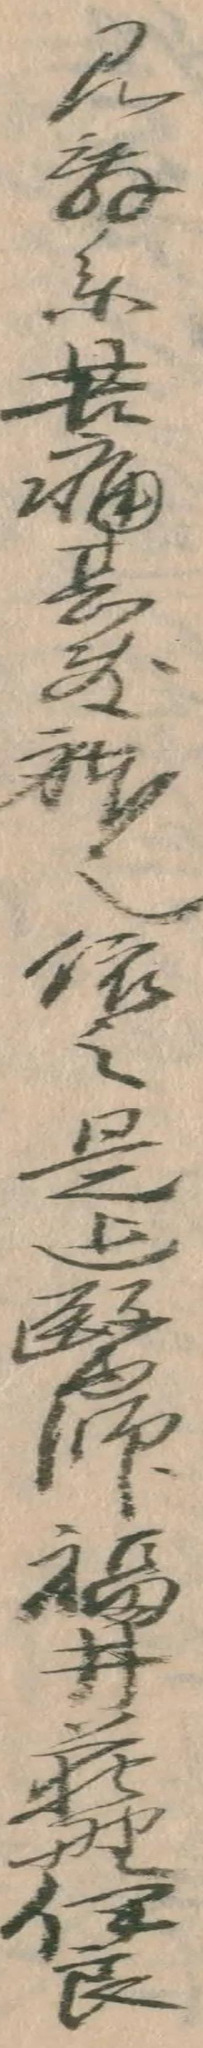見舞参共痛甚敷躰也依之是迄醫師福井蔵野伊良
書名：賀茂社記録. 第67冊
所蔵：国立国会図書館 National Diet Library, JAPAN
